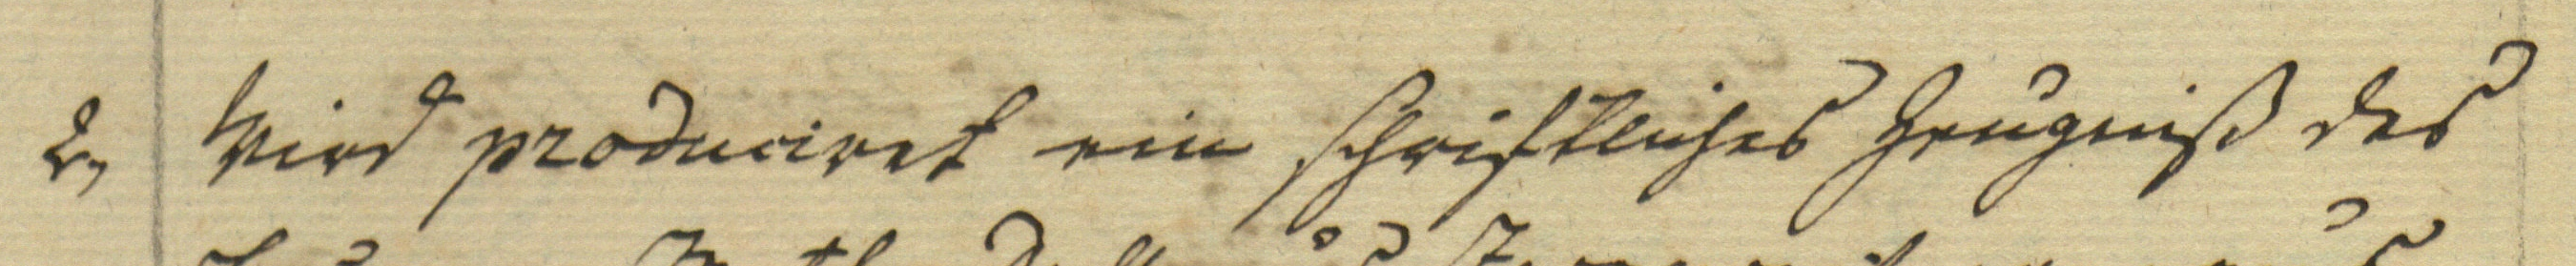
2. Wird produciret ein schriftliches Zeugniß des
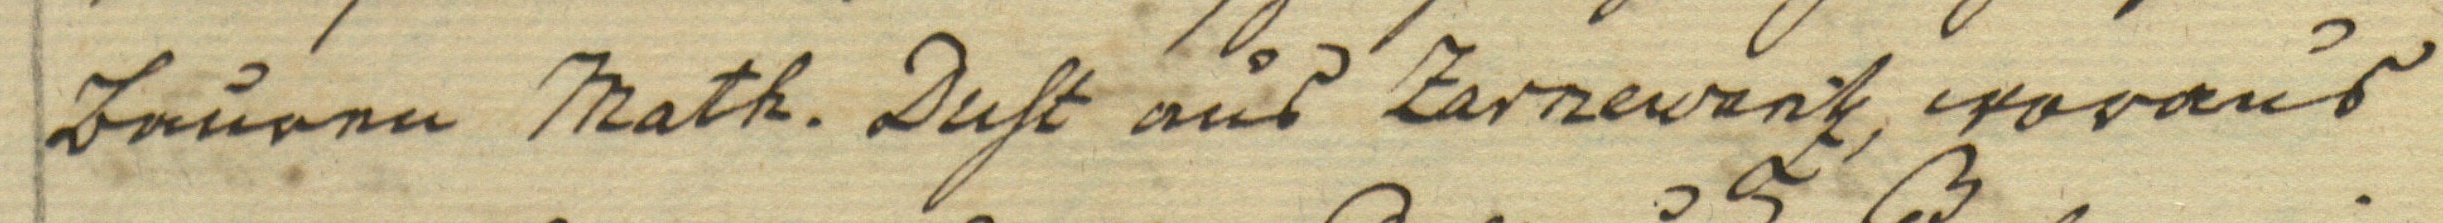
Bauren Math. Dust aus Zarnewantz, woraus
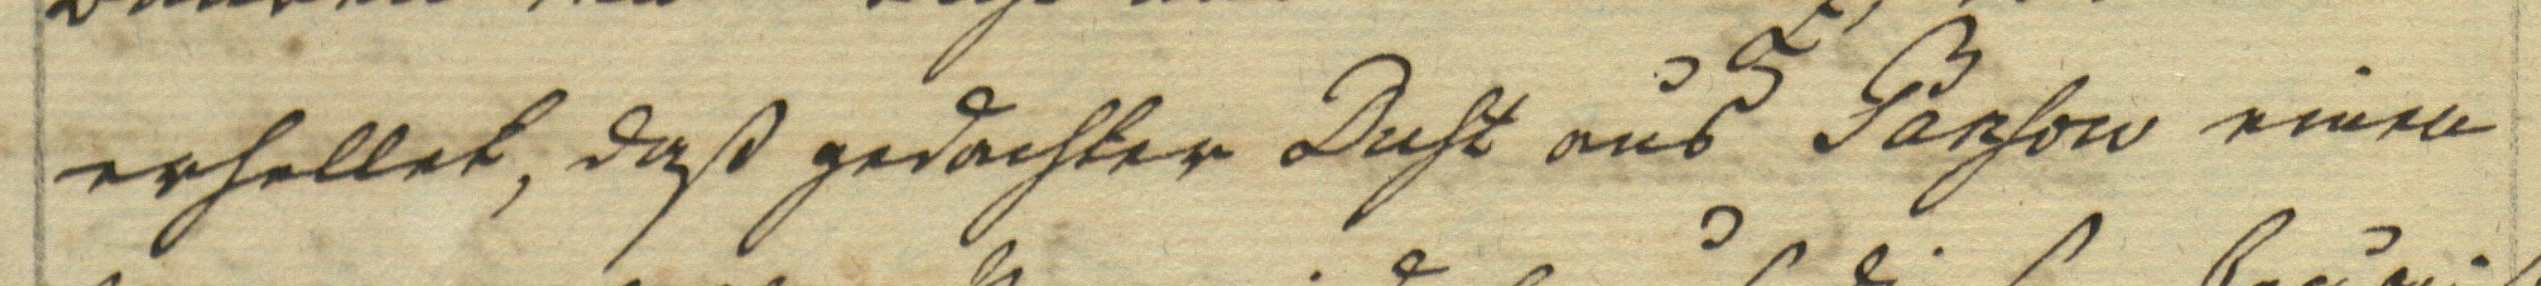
erhellet, daß gedachter Dust aus Pansow einen
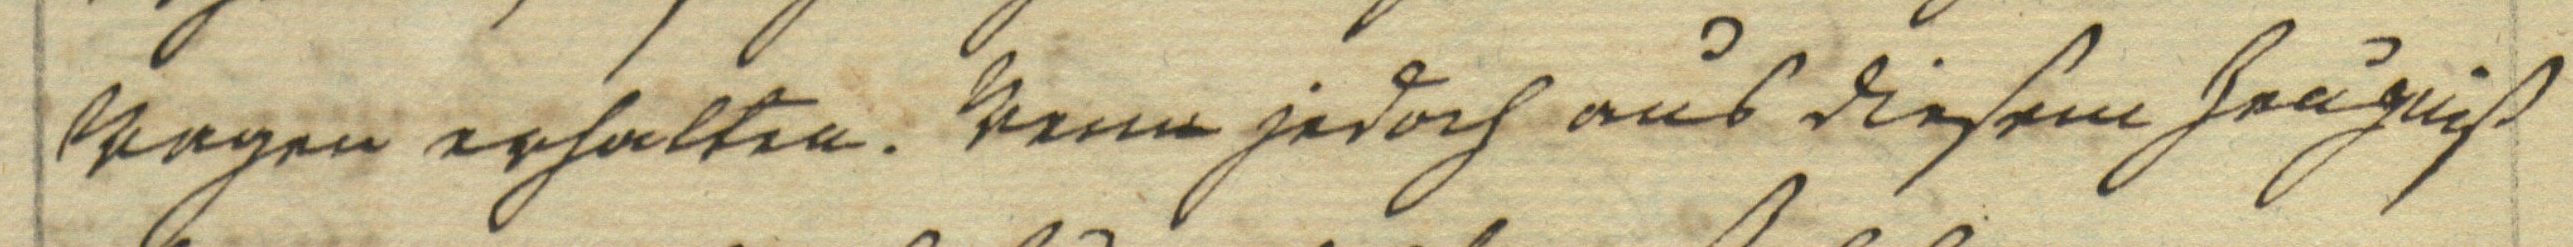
Wagen erhalten. Wenn jedoch aus diesem Zeugniß
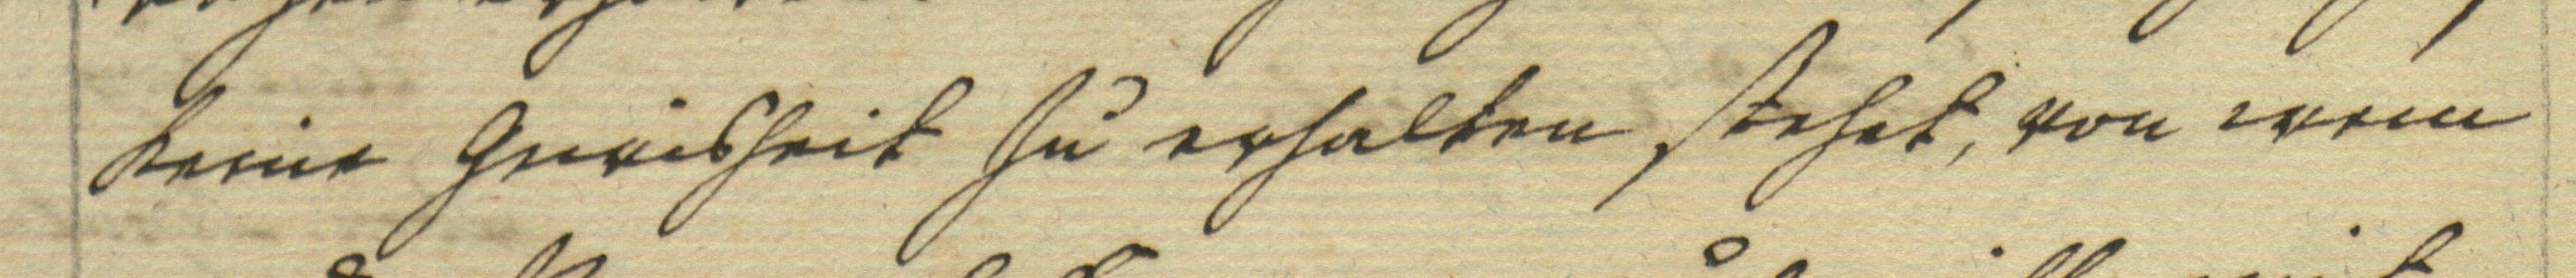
keine Gewisheit zu erhalten stehet, von wem
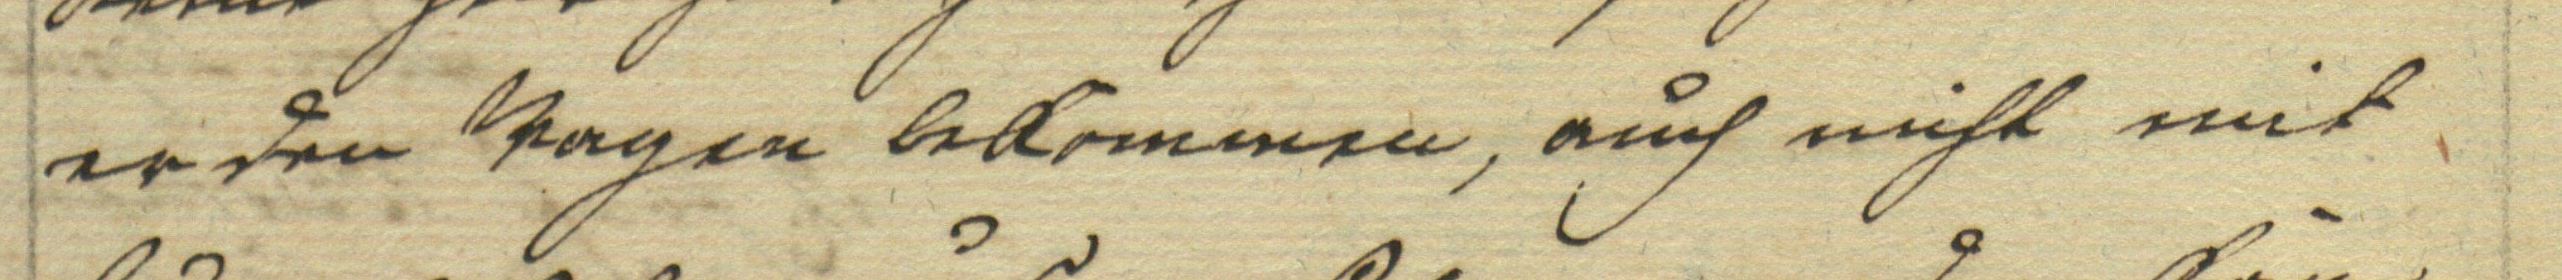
er den Wagen bekommen, auch nicht mit
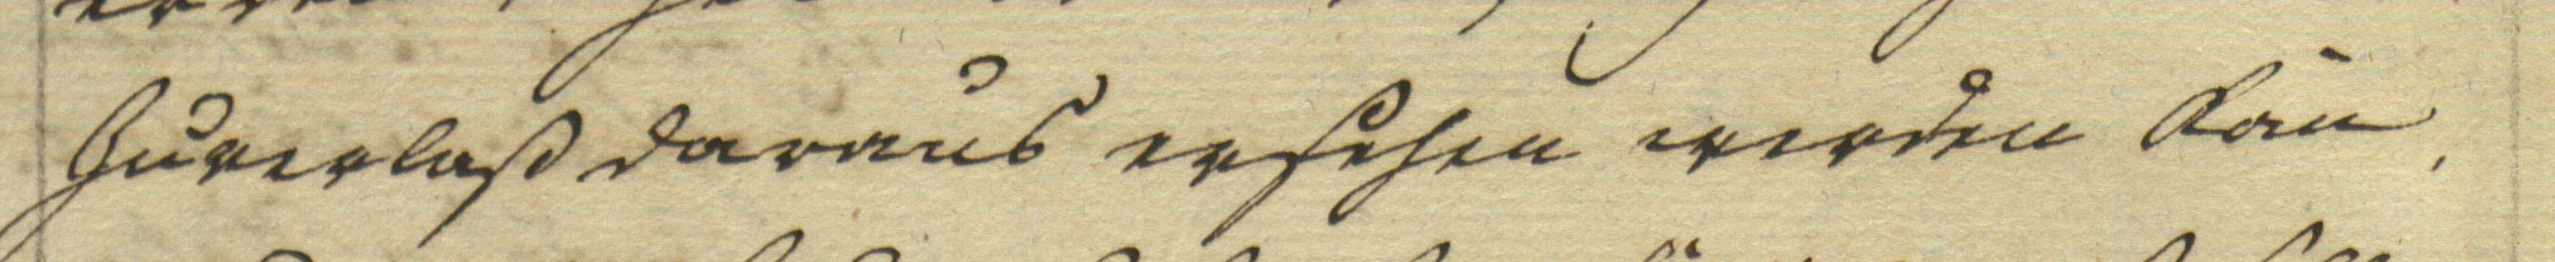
Zuverlaß daraus ersehen werden kan,
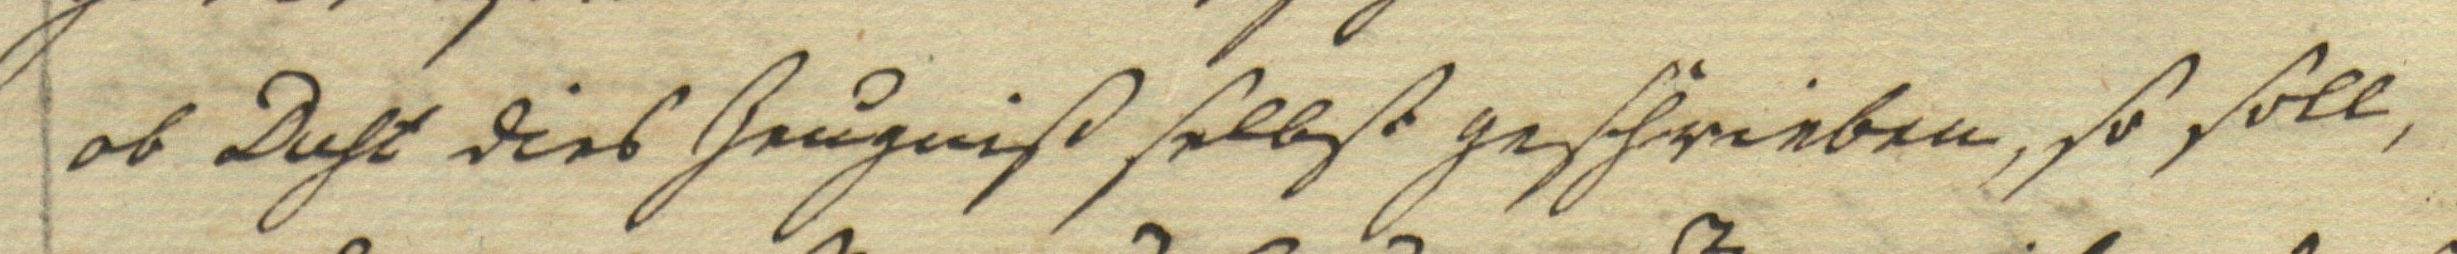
ob Dust dies Zeugniß selbst geschrieben, so soll,
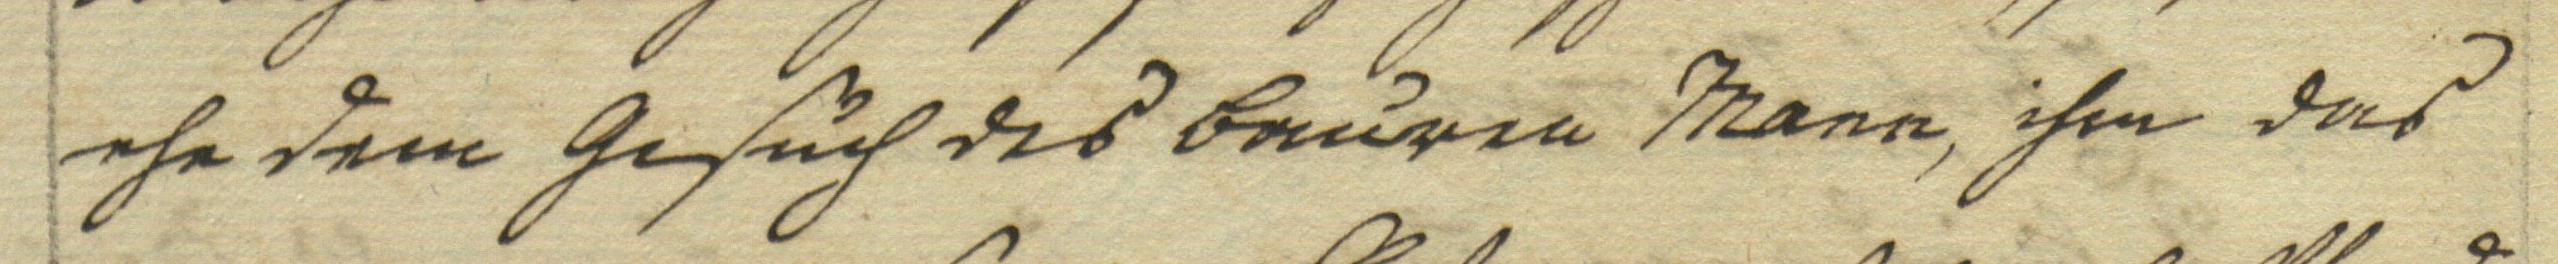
ehe dem Gesuch des Bauren Mann, ihm das
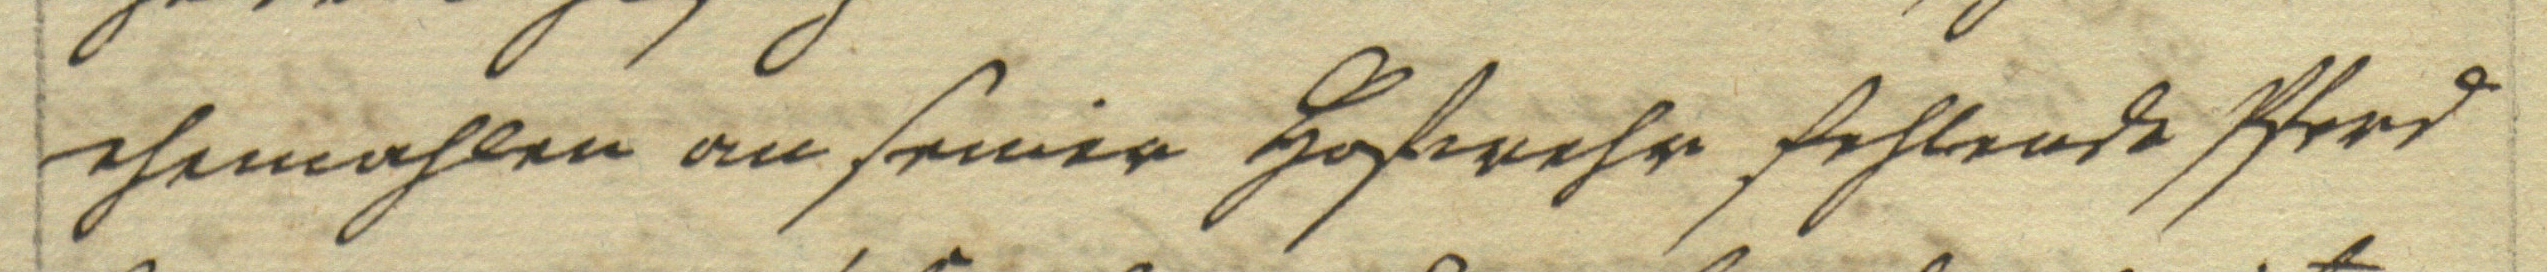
ehemahlen an seiner Hofwehr fehlende Pferd
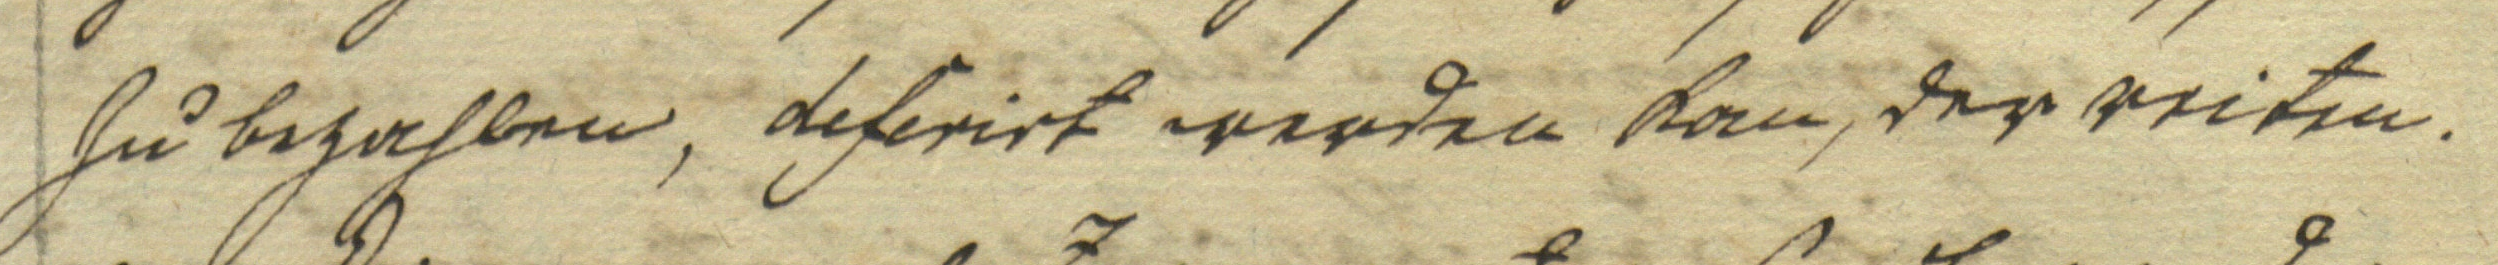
zu bezahlen, deferirt werden kan, der reiten¬
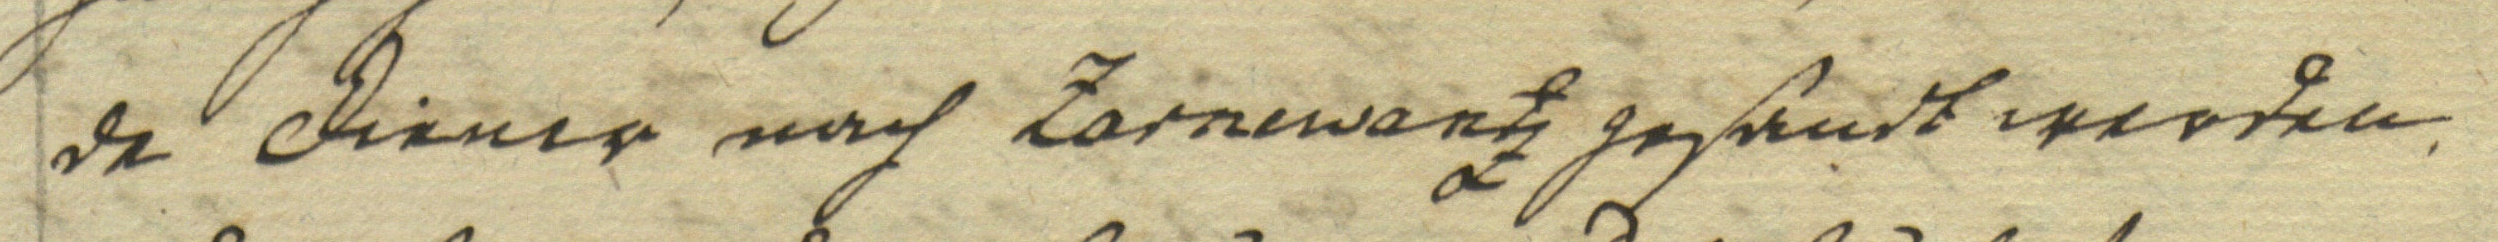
de Diener nach Zarnewantz gesandt werden,
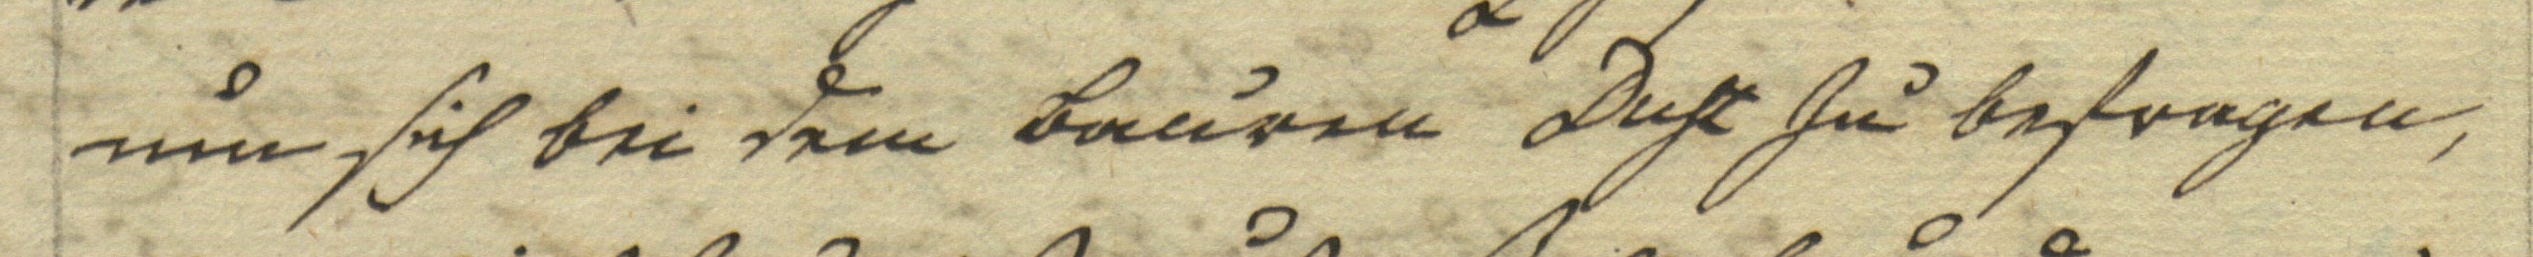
um sich bei dem Bauren Dust zu befragen,
